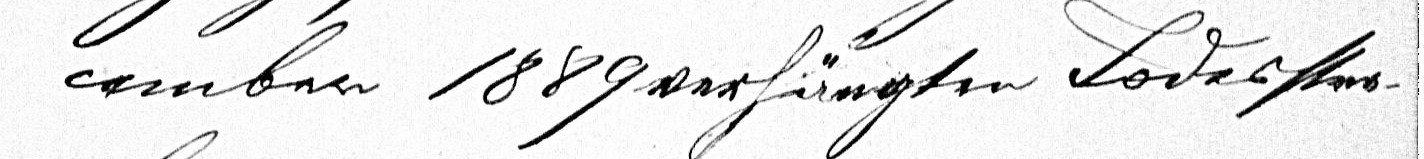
cember 1889 verhängten Todesstra¬
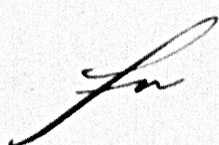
fe
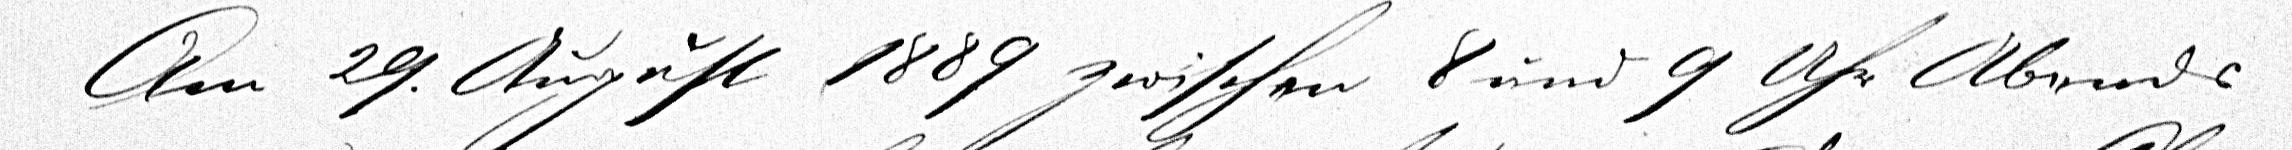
Am 29. August 1889 zwischen 8 und 9 Uhr Abends
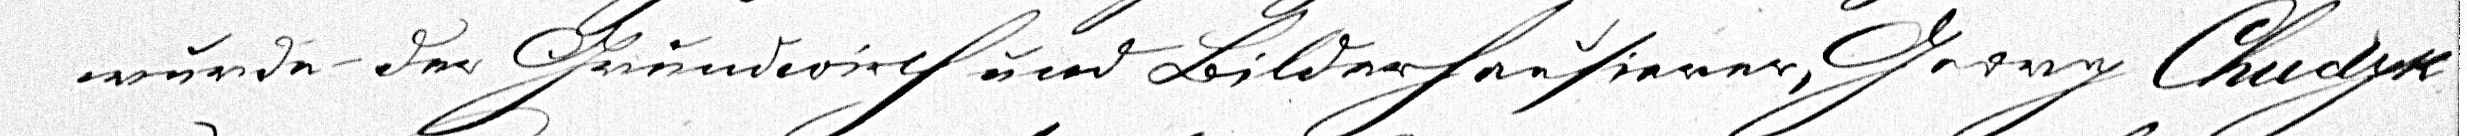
wurde - der Grundwirth und Bilderhausierer, Georg Chudyk
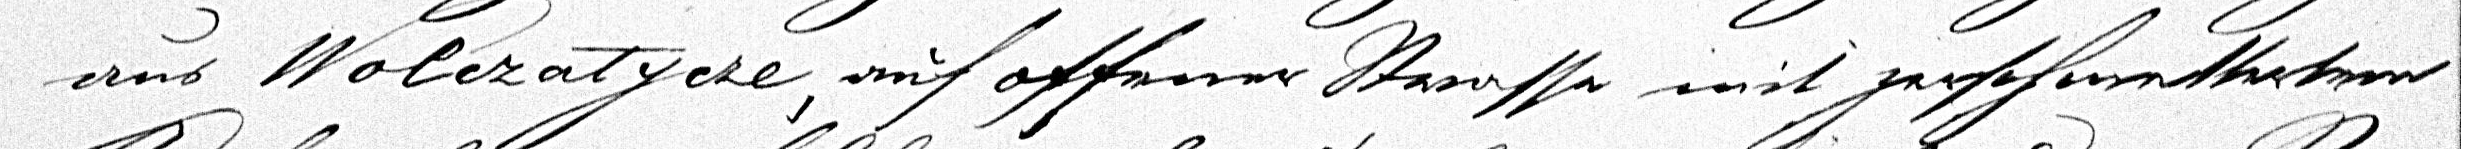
aus Wolczatycze, auf offener Strasse mit zerschmettertem
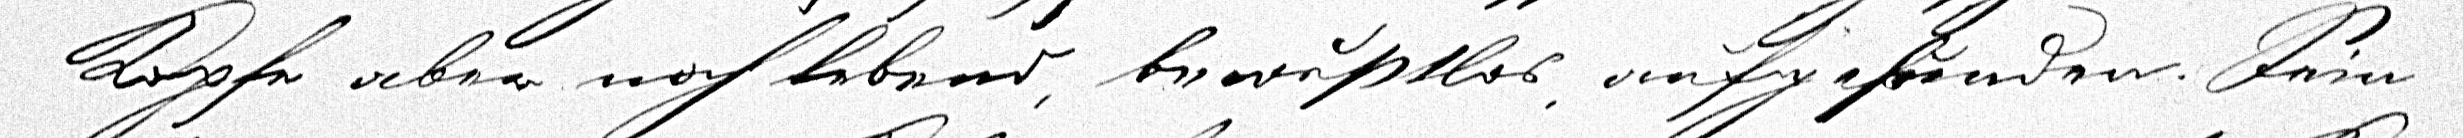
Kopfe aber nochlebend, bewußtlos aufgefunden Sein
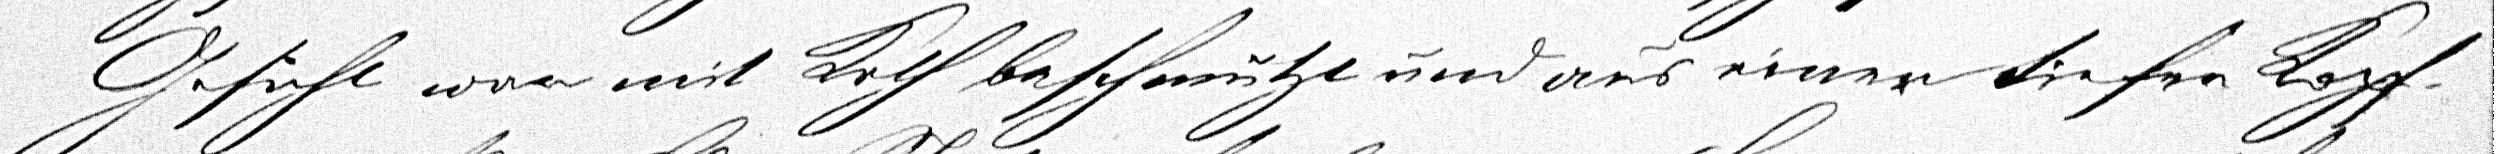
Gesicht war mit Koth beschmutzt und aus einer tiefen Kopf¬
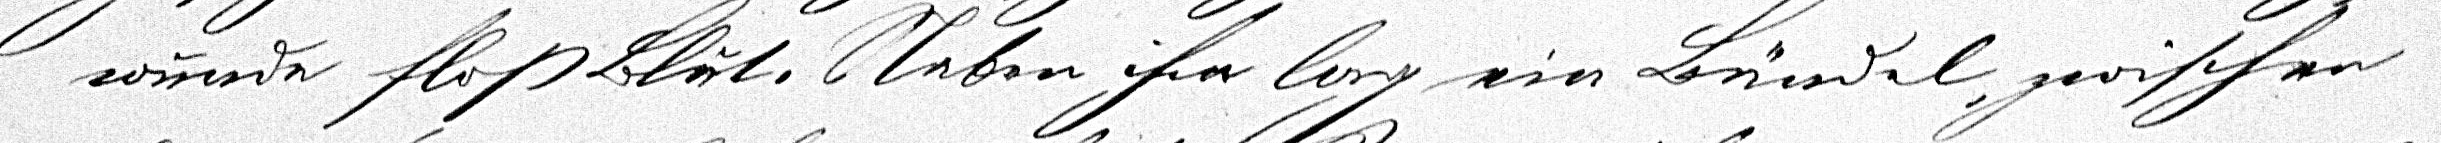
wunde floß Blut. Neben ihm lag ein Bündel, zwischen
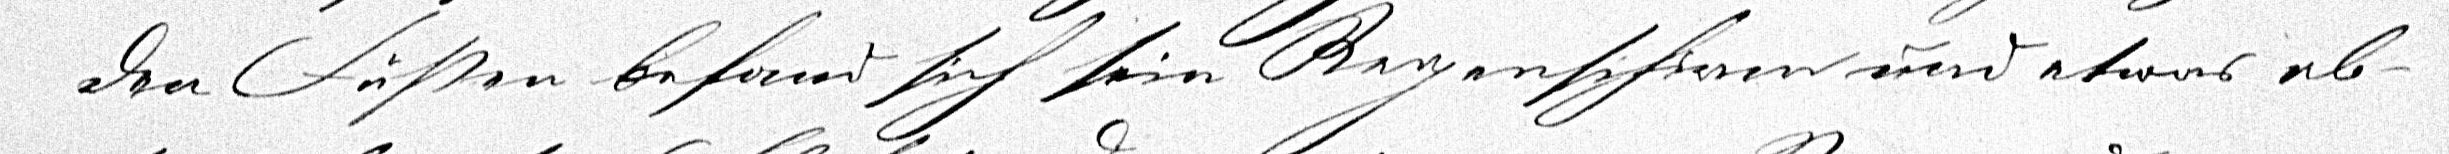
den Füßen befand sich sein Regenschirm und etwas ab¬
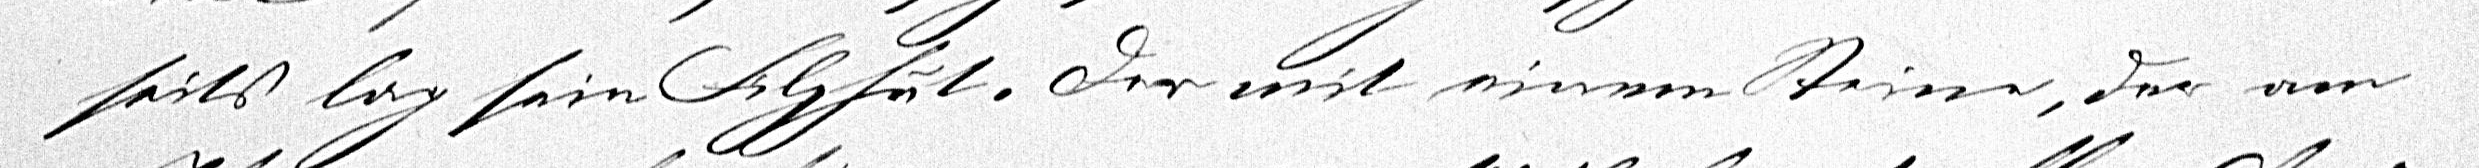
seits lag sein Filzhut. Der mit einem Steine, der am
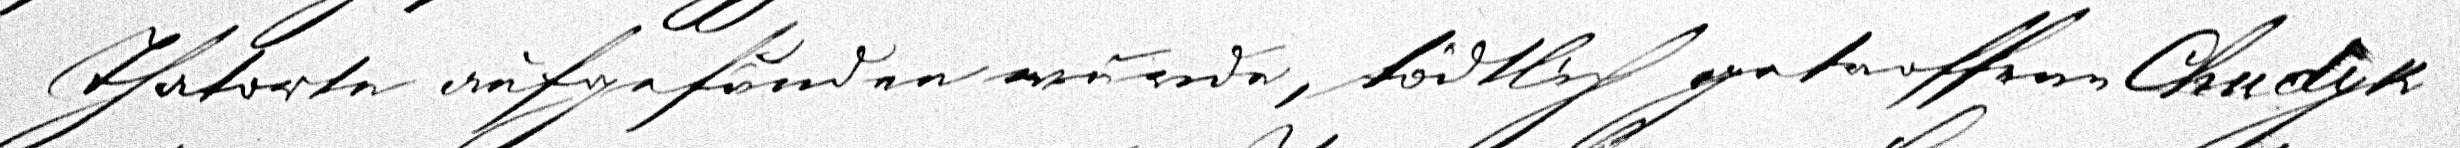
Thatorte aufgefunden wurde, tödtlich getroffene Chudyk
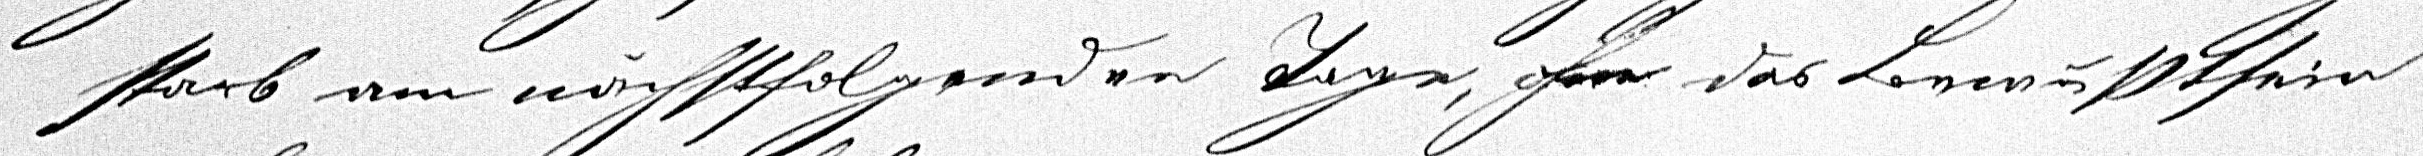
starb am nächstfolgenden Tage, ohne das Bewusstsein
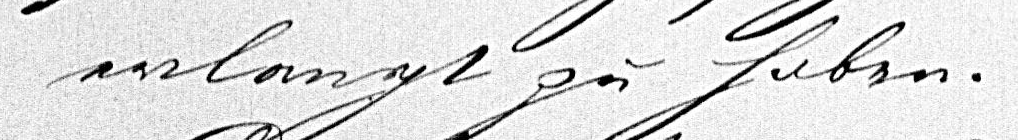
erlangt zu haben.
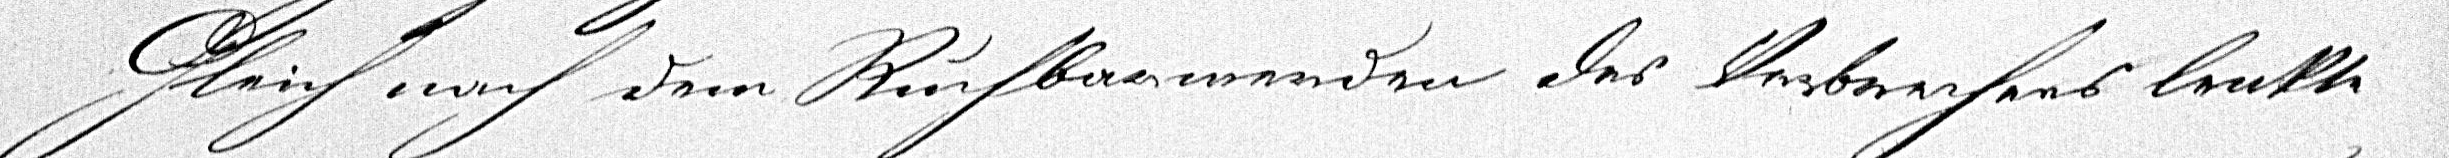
Gleich nach dem Ruchbarwerden des Verbrechens lenkte
